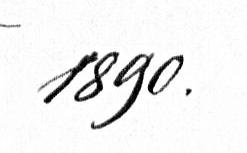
1890.
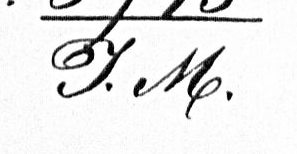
J.M.
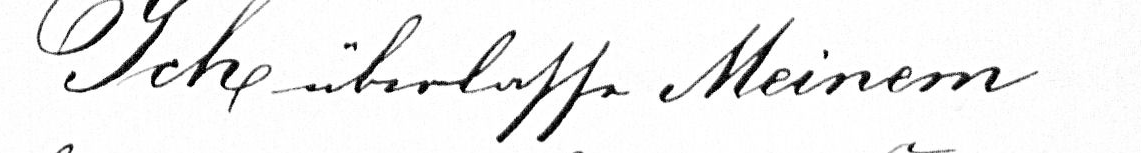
Ich überlasse Meinem
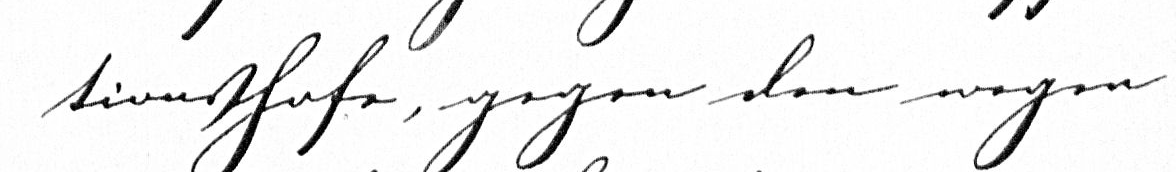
tionshofe, gegen den wegen
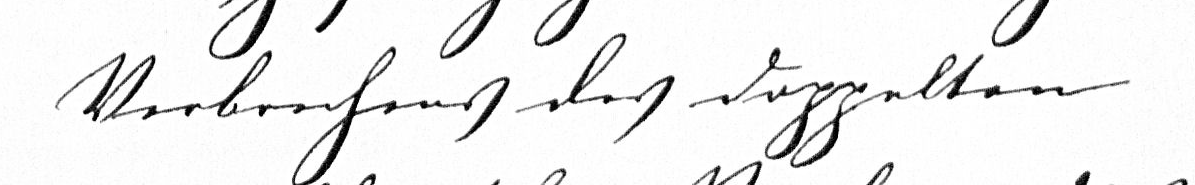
Verbrechens des doppelten
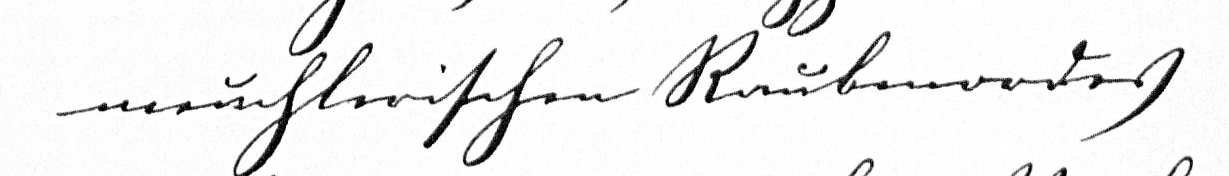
meuchlerischen Raubmordes
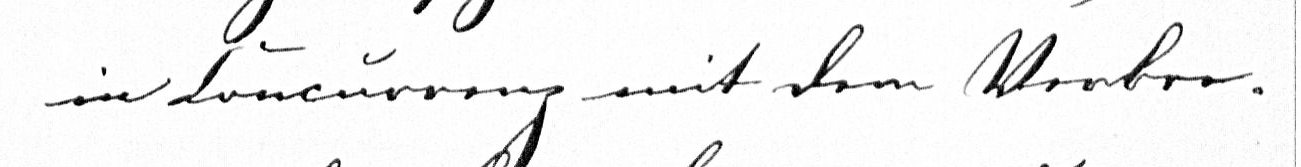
in Concurrenz mit dem Verbre¬
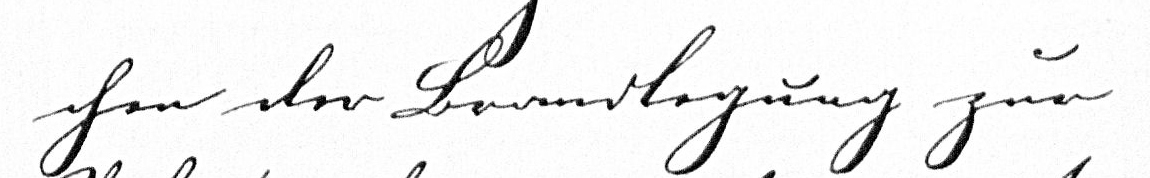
chen der Brandlegung zur
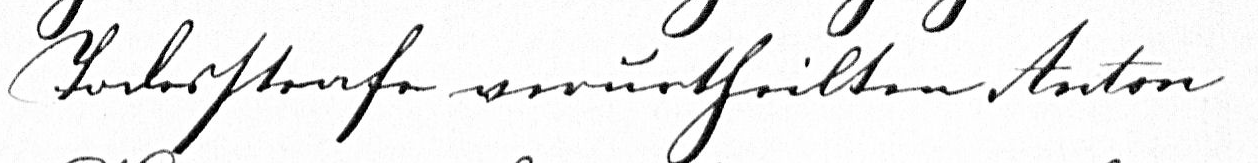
Todesstrafe verurtheilten Anton
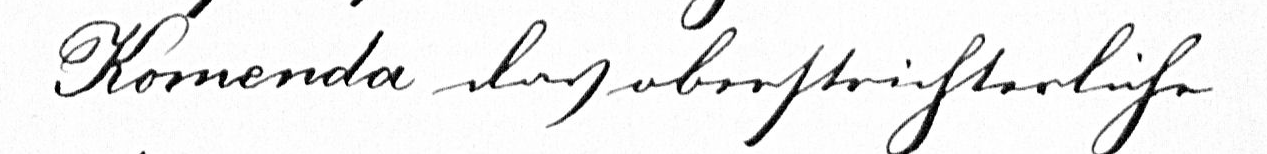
Komenda das oberstrichterliche
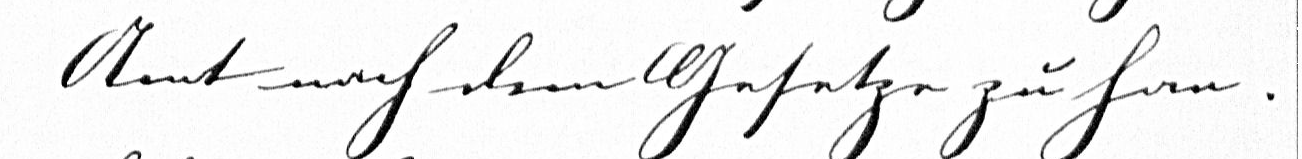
Amt nach dem Gesetze zu han¬
